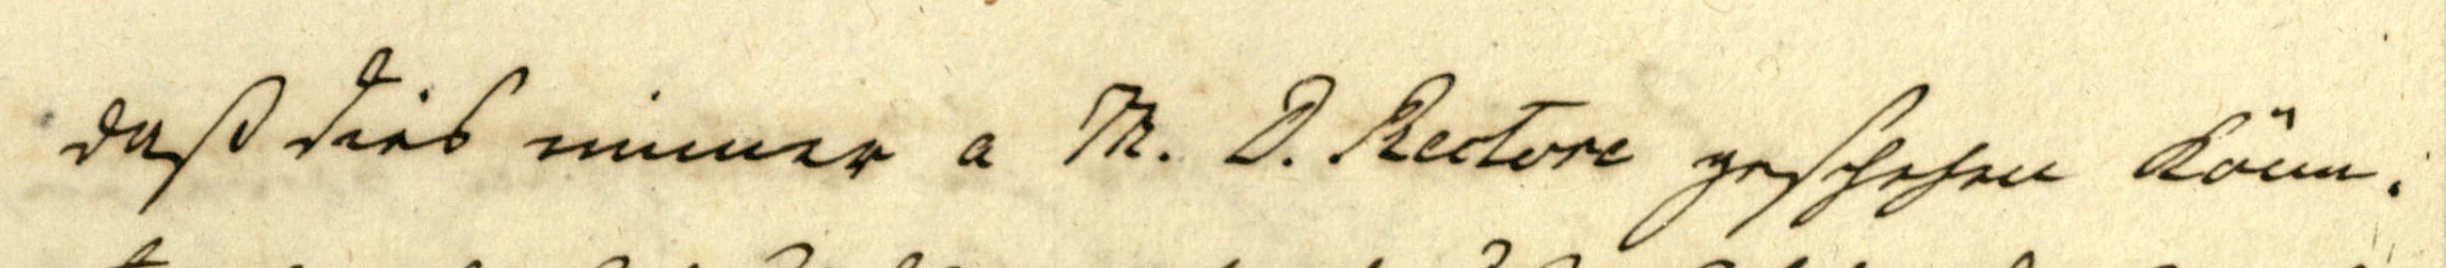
daß dies immer a M. D. Rectore geschehen könn¬
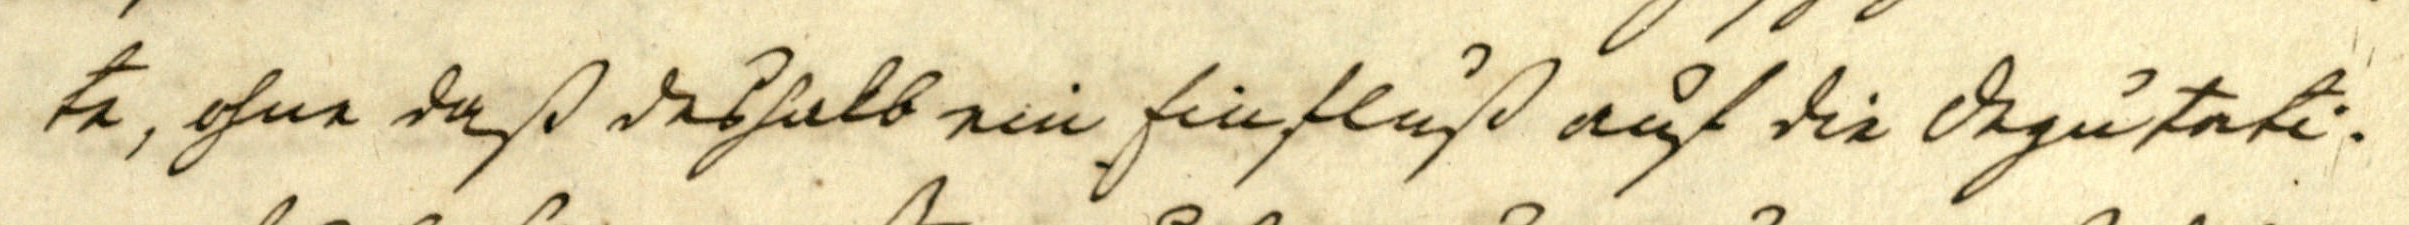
te, ohne daß deshalb ein Einfluß auf die Deputati¬
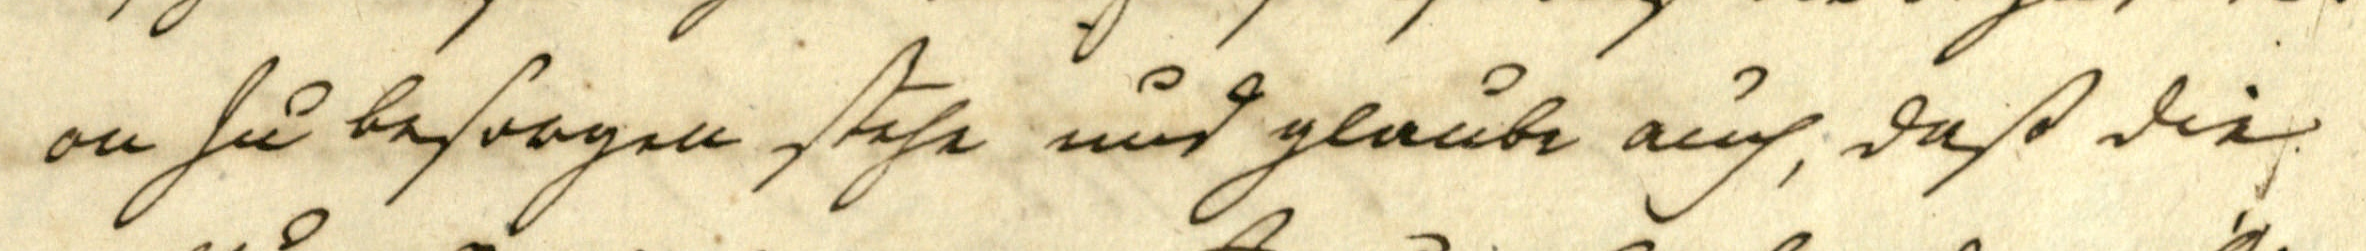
on zu besorgen stehe und glaube auch, daß die
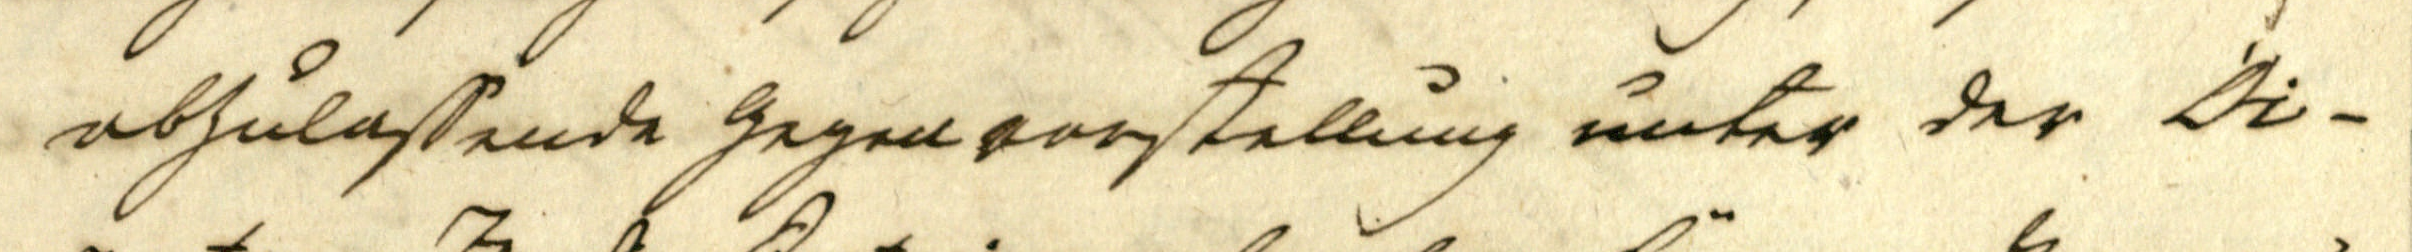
abzulassende Gegenvorstellung unter der Di¬
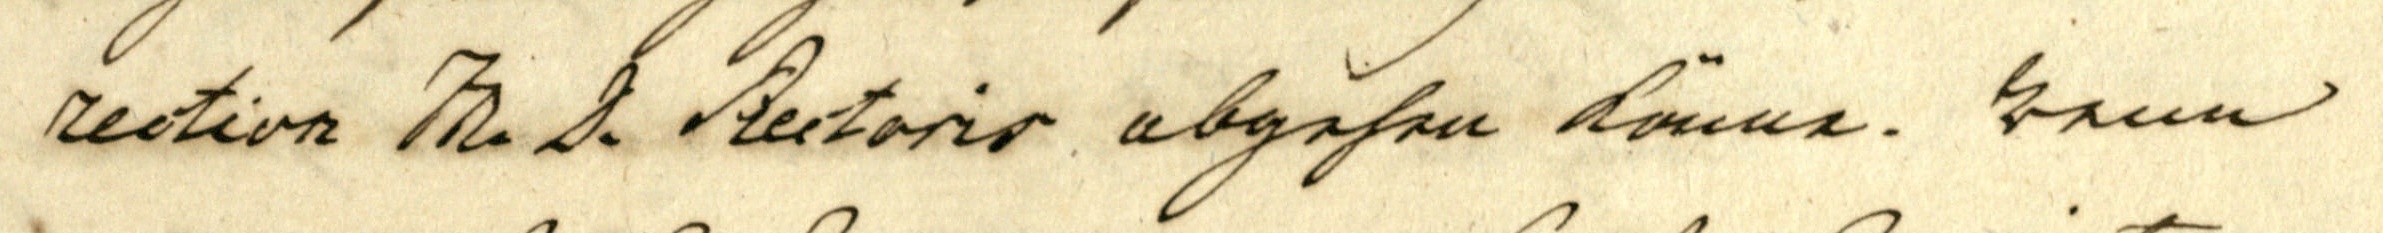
rection M. D. Rectoris abgehen könne. Wenn
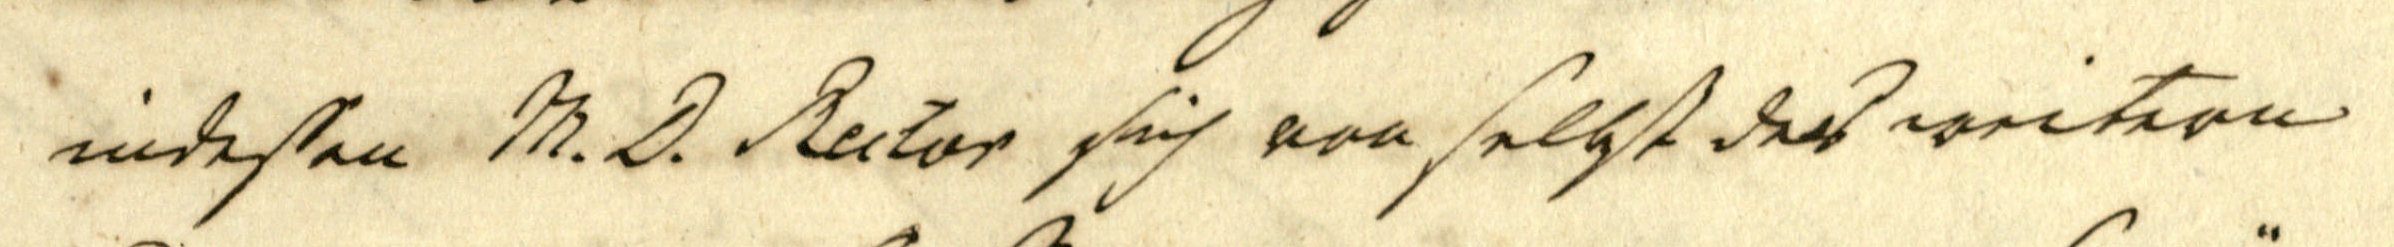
indessen M. D. Rector sich von selbst der weitern
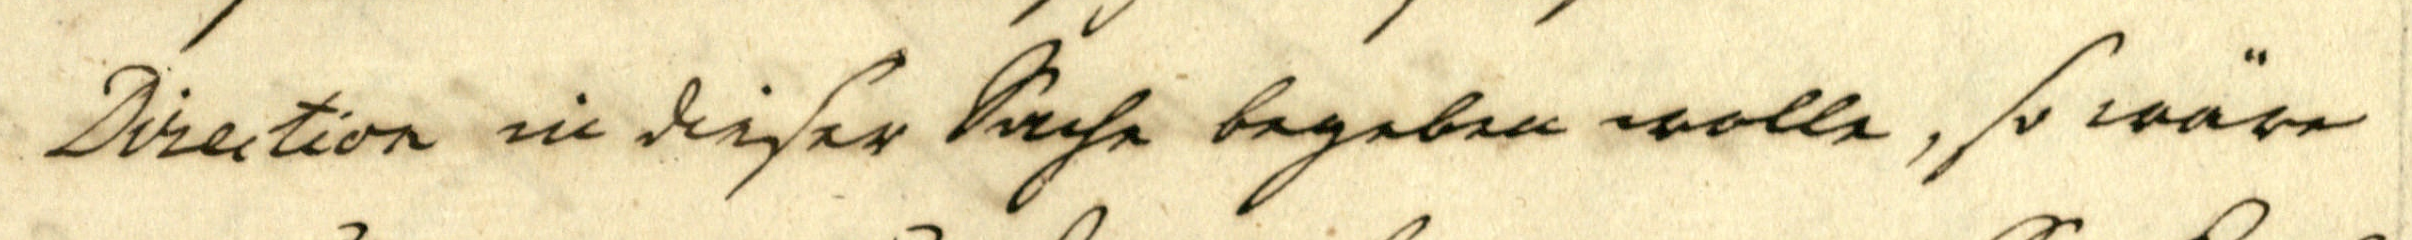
Direction in dieser Sache begeben wolle, so wäre
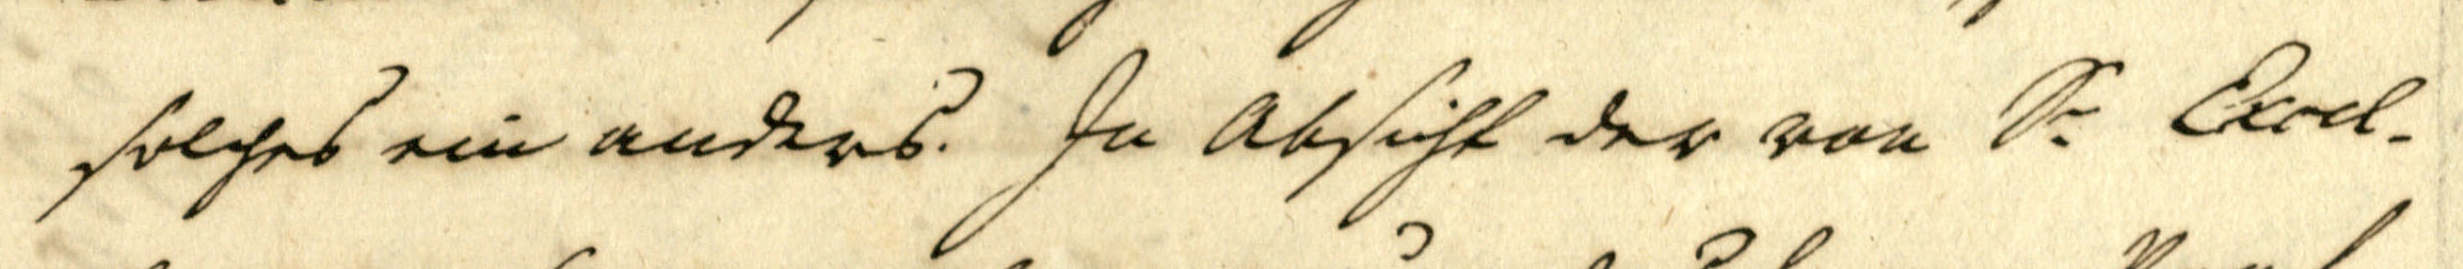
solches ein anders. In Absicht der von Sr. Excel¬
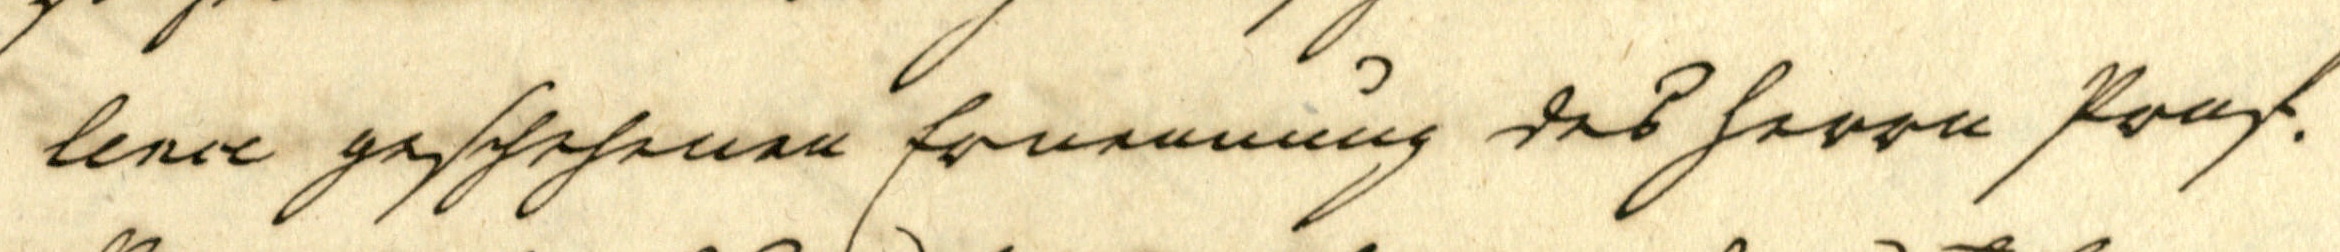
lence geschehenen Ernennung des Herrn Prof.
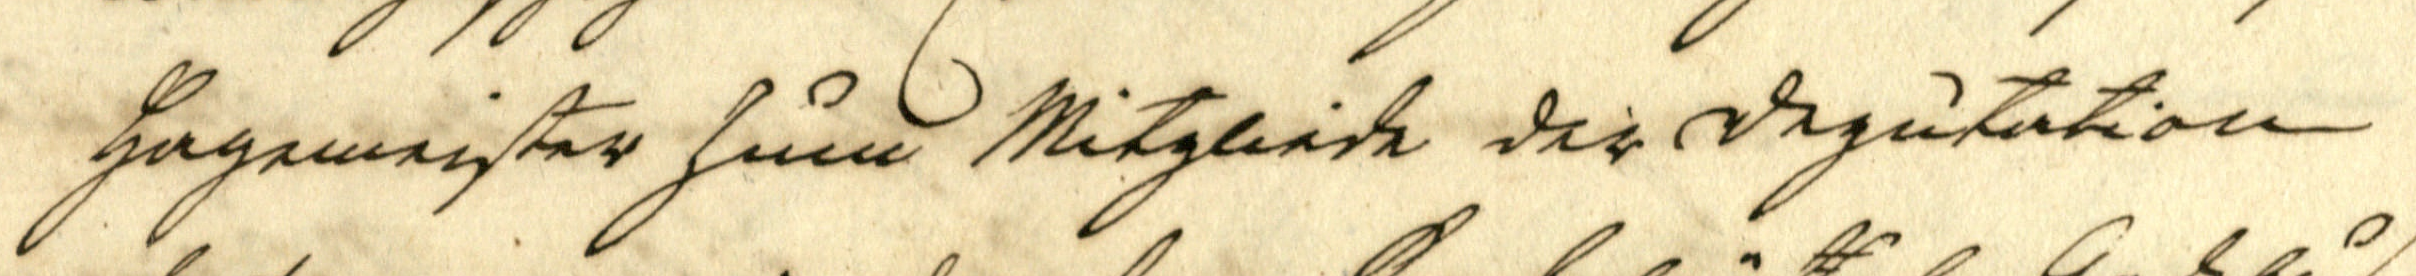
Hagemeister zum Mitgliede der Deputation
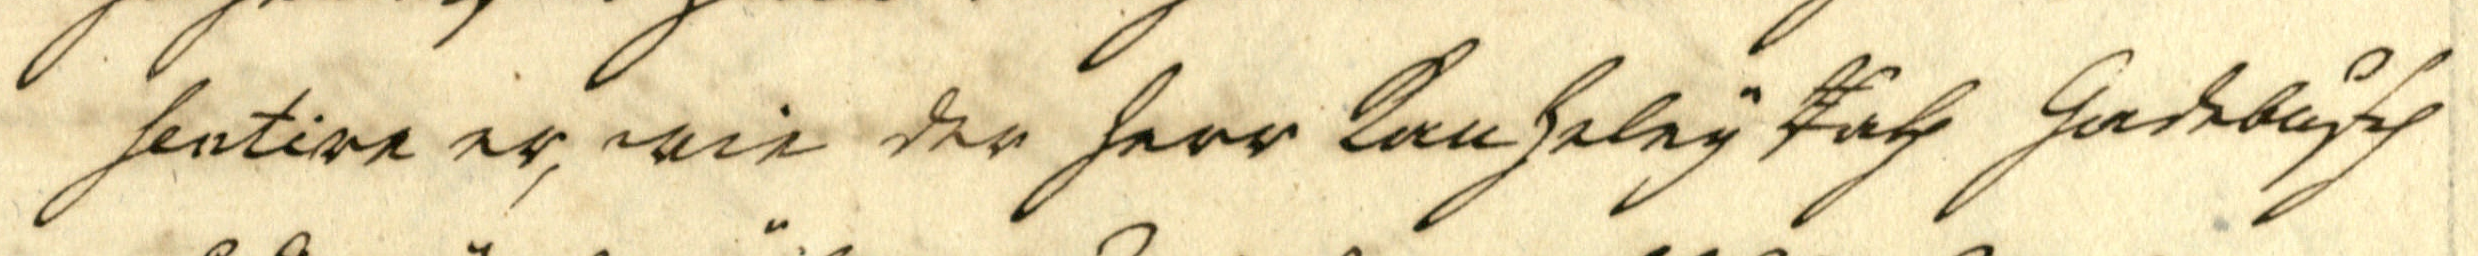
sentire er, wie der Herr Kanzeleÿ Rath Gadebusch
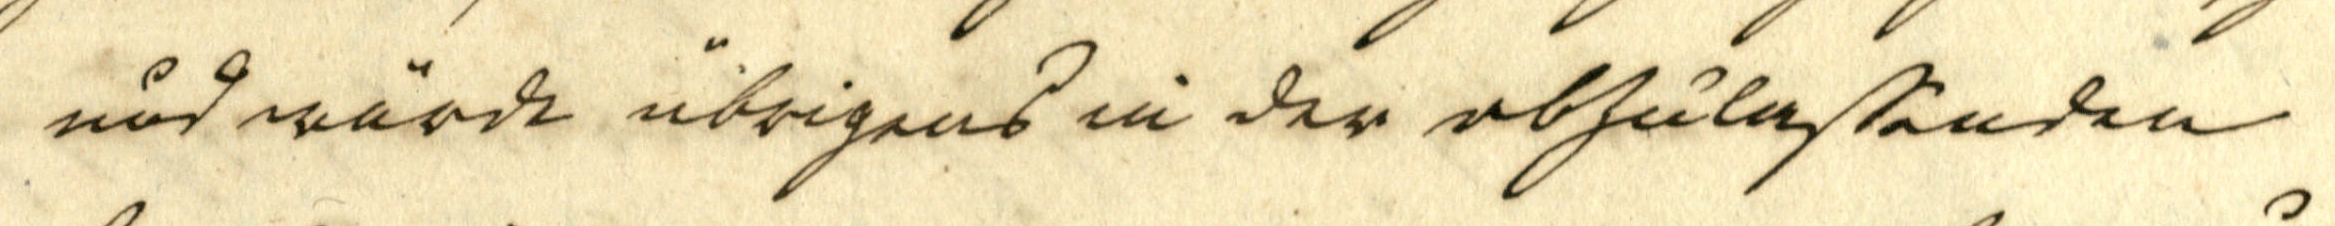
und würde übrigens in der abzulassenden
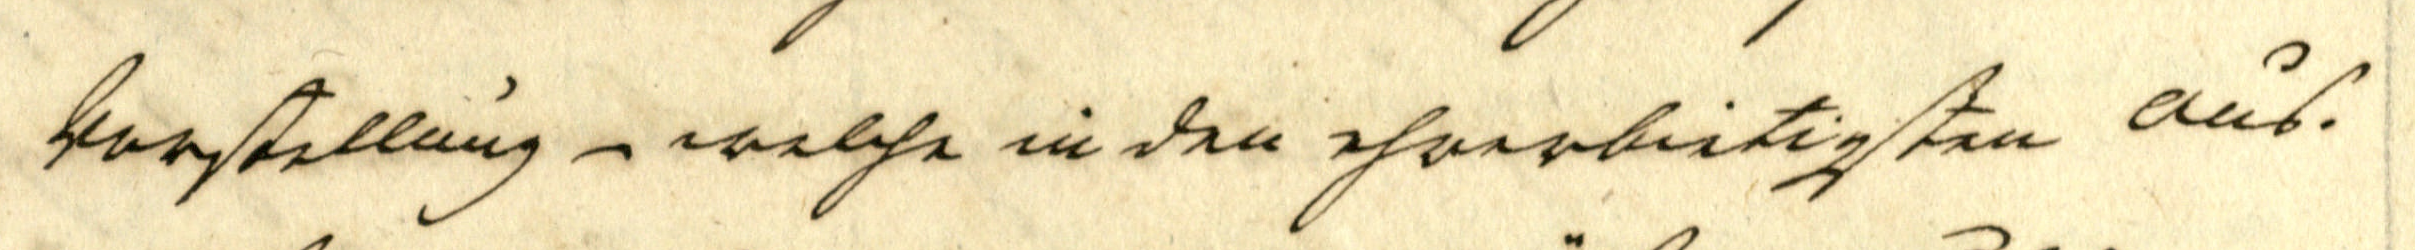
Vorstellung, welche in den ehrerbietigsten Aus
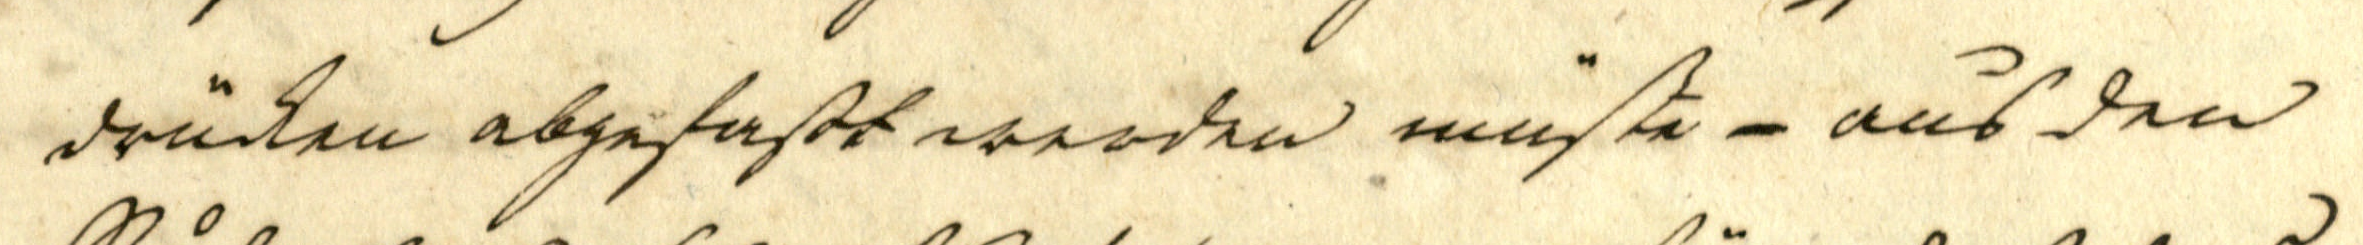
drücken abgefaßt werden müßte, aus den
